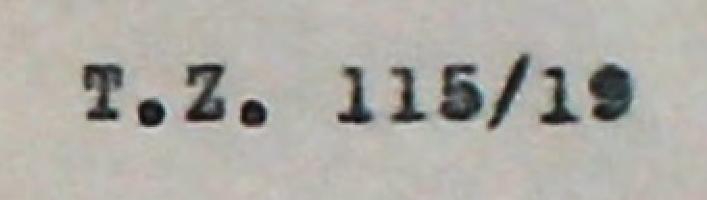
T.Z. 115/19
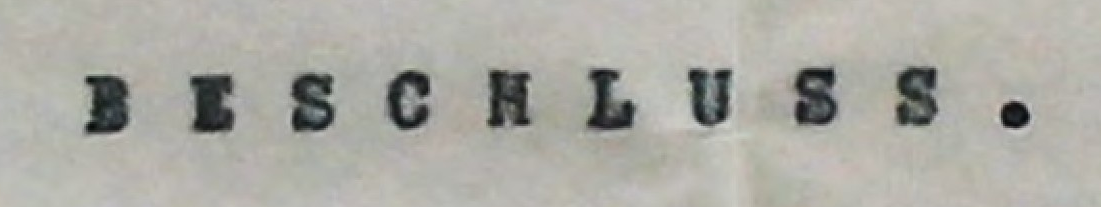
BESCHLUSS.
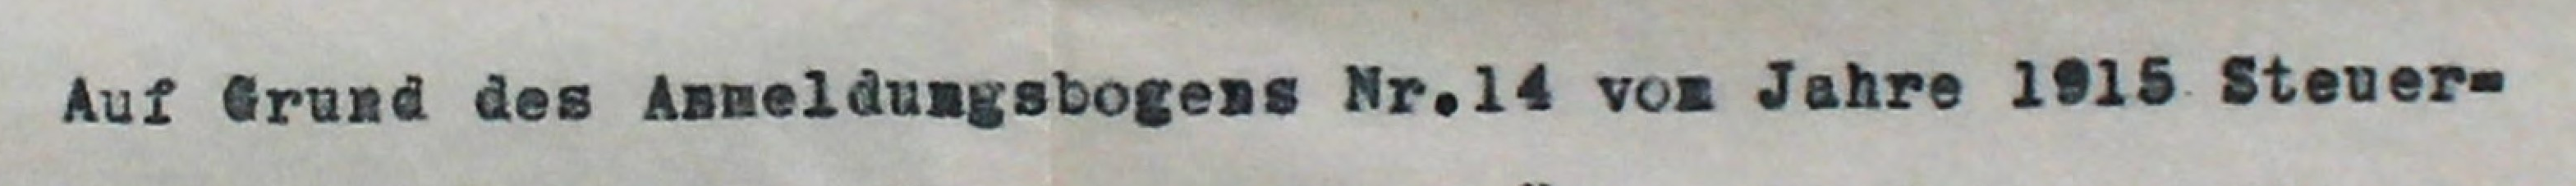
Auf Grund des Anmeldungsbogens Nr.14 vom Jahre 1915 Steuer=
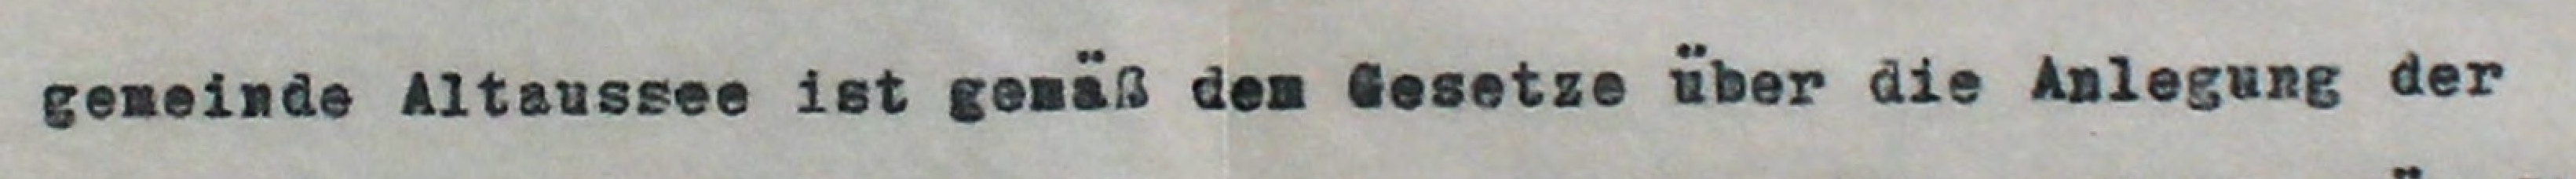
gemeinde Altaussee ist gemäß dem Gesetze über die Anlegung der
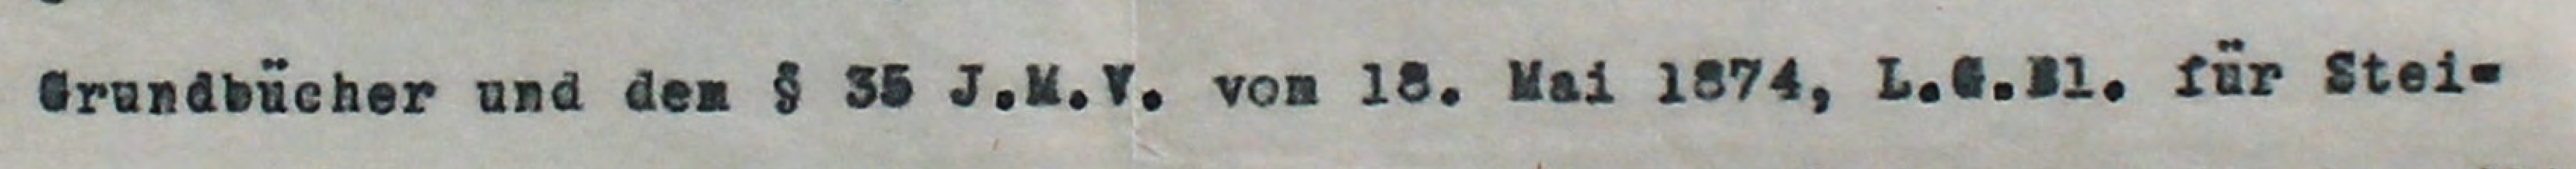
Grundbücher und dem § 35 J.M.V. vom 18. Mai 1874, L.G.Bl. für Stei=
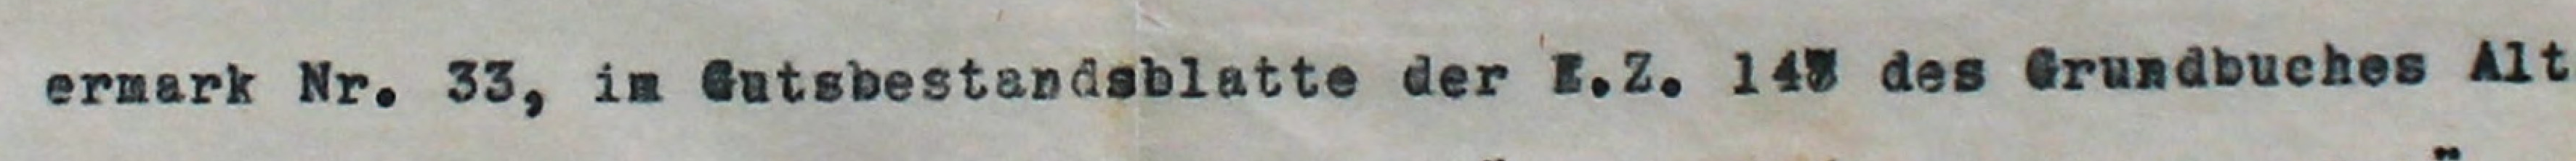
ermark Nr. 33, im Gutsbestandsblatte der E.Z. 147 des Grundbuches Alt-
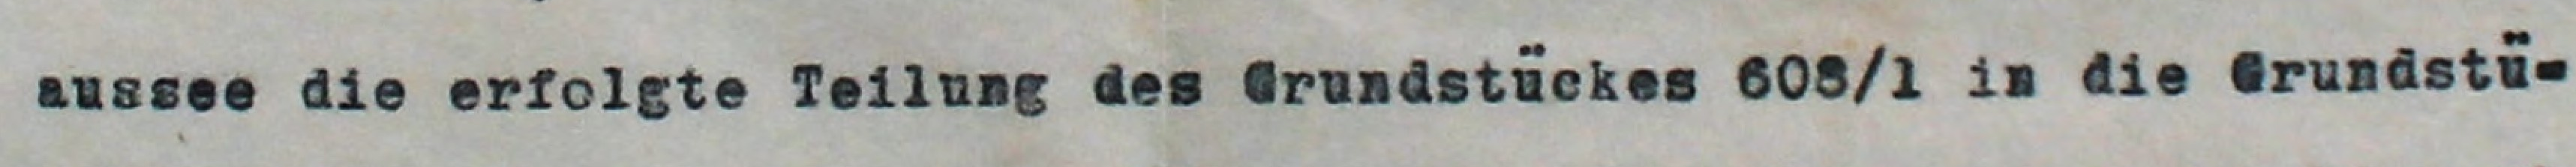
aussee die erfolgte Teilung des Grundstückes 608/1 im die Grundstü=
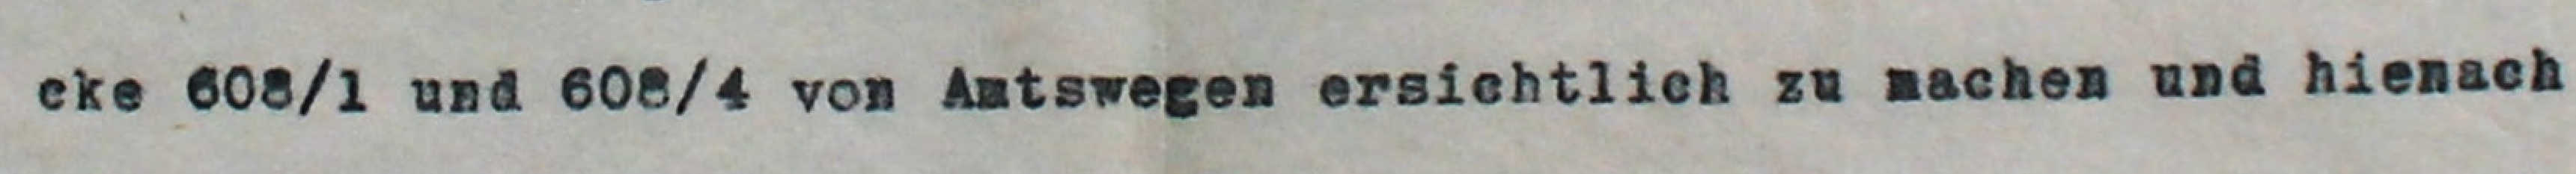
cke 608/1 und 608/4 vom Amtswegen ersichtlich zu machen und hienach
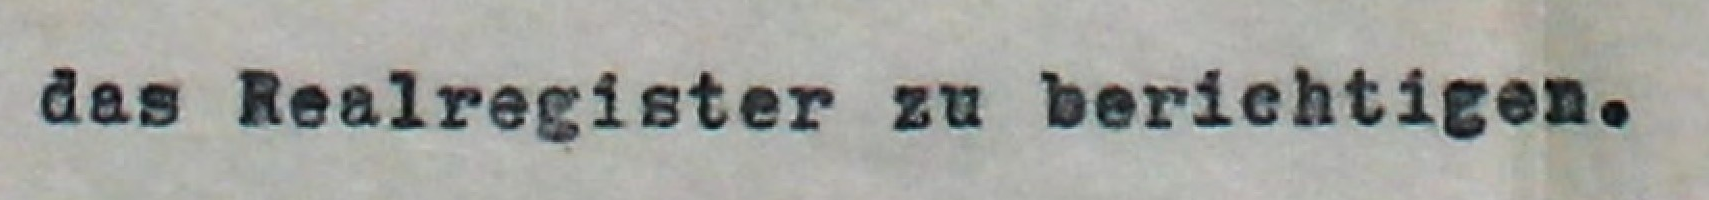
das Realregister zu berichtigen.
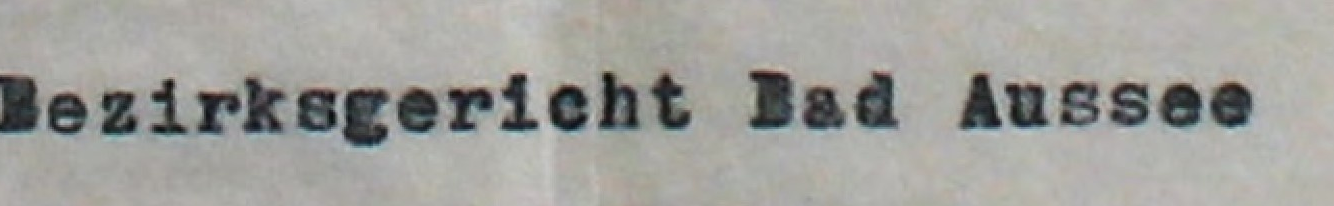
Bezirksgericht Bad Aussee
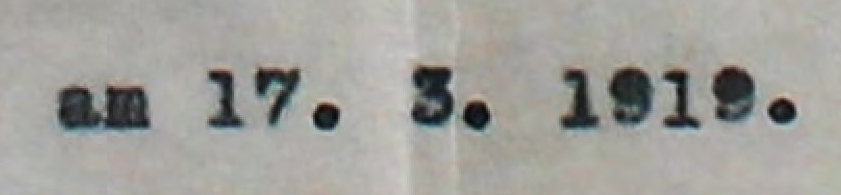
am 17. 3. 1919.
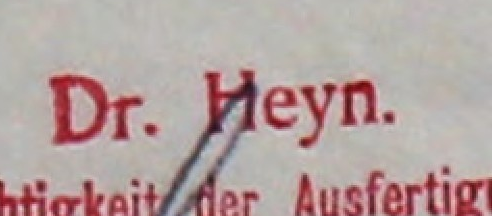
Dr. Heyn.
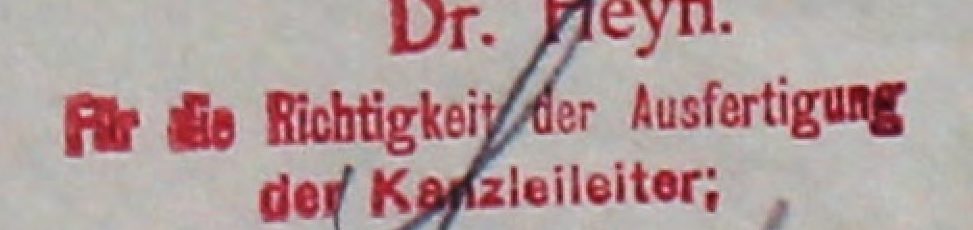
Für die Richtigkeit der Ausfertigung
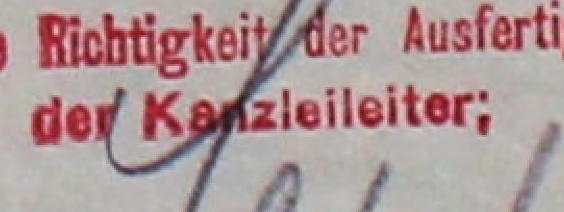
der Kanzleileiter;
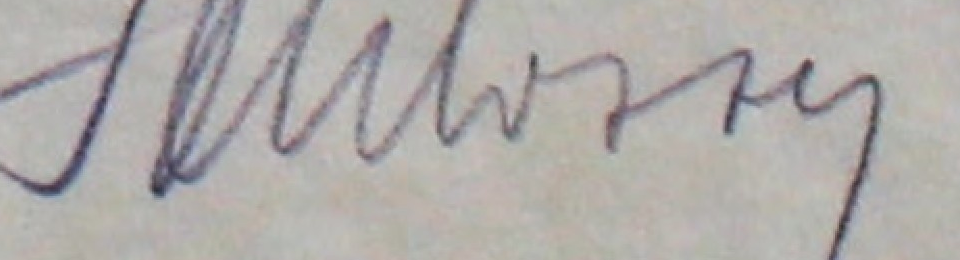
Schlossen
